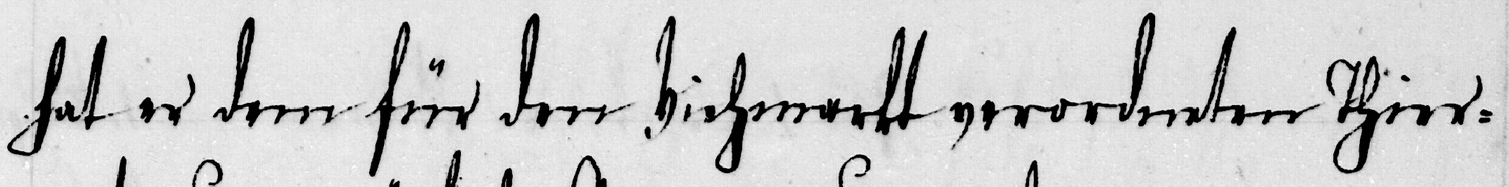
hat er dem für den Viehmarkt verordneten Thier¬
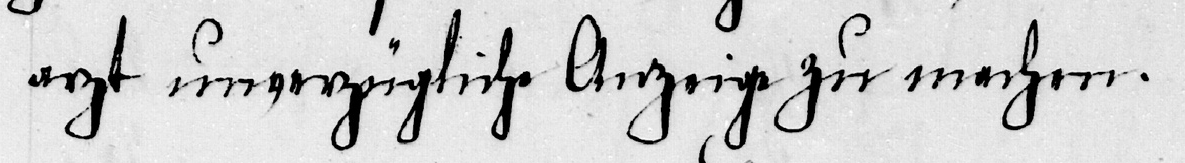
arzt unverzüglich Anzeige zu machen.
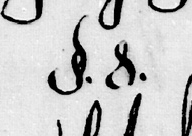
§. 8.
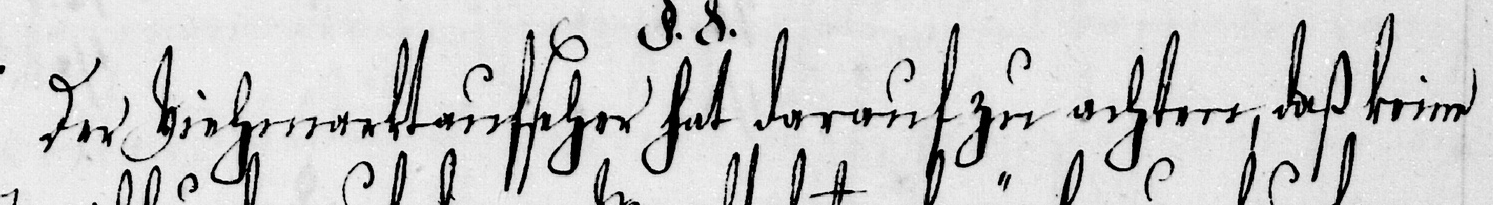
Der Viehmarktaufseher hat darauf zu achten, daß keine
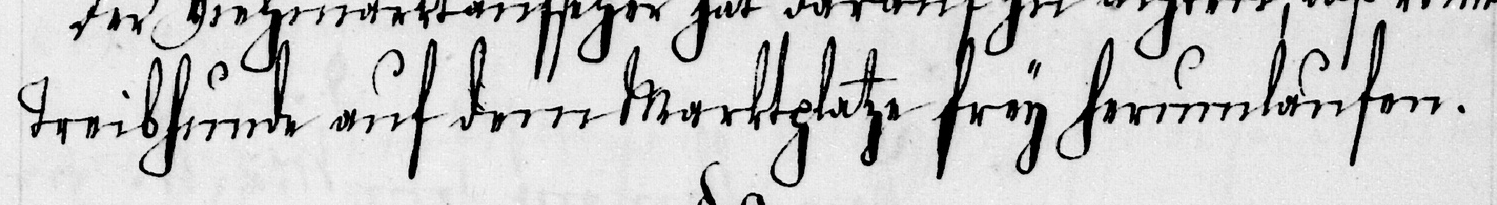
Treibhunde auf dem Marktplatze frey herumlaufen.
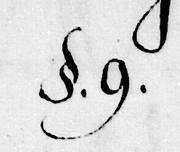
§. 1.
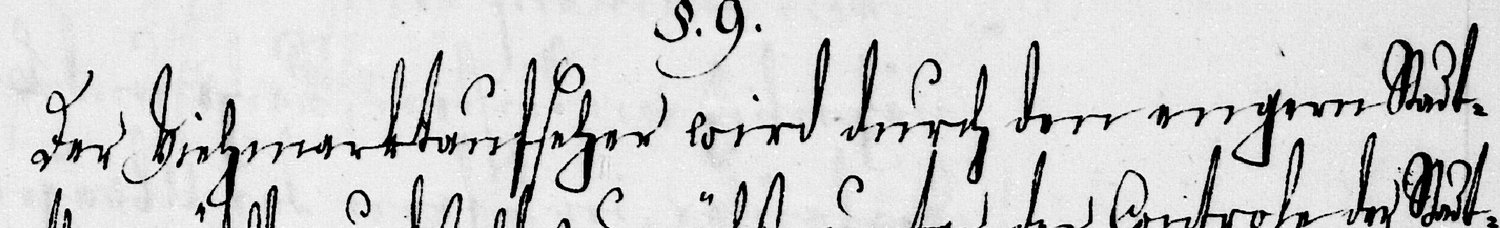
Der Viehmarktaufseher wird durch den engern Stadt¬
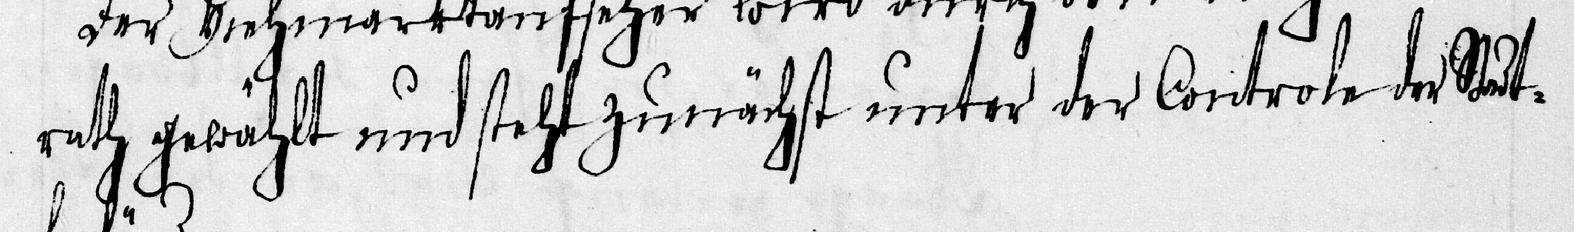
rath gewählt und steht zunächst unter der Controle der Stadt¬
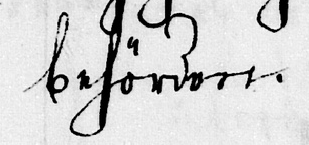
behörden.
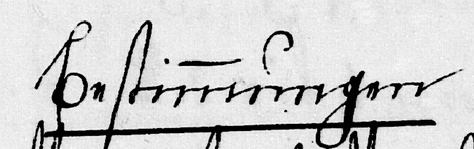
Bestimmungen
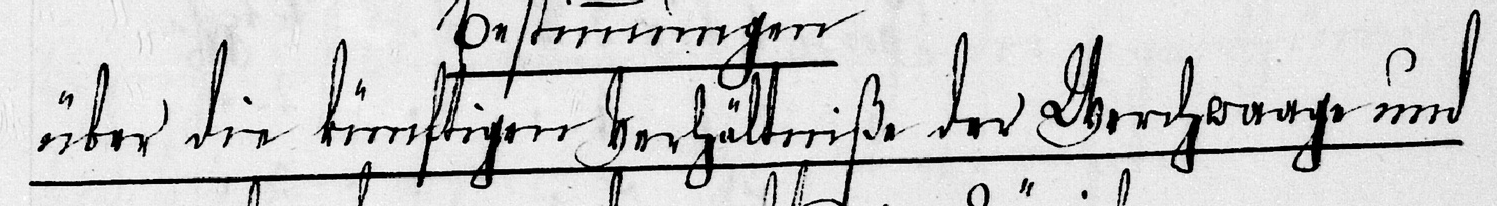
über die künftigen Verhältniße der Werchwaage und
